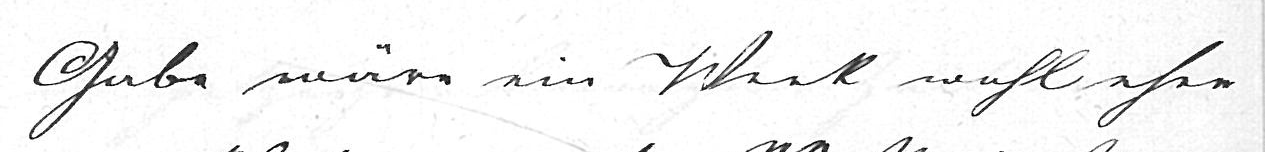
Gabe wäre ein Werk wohl eher
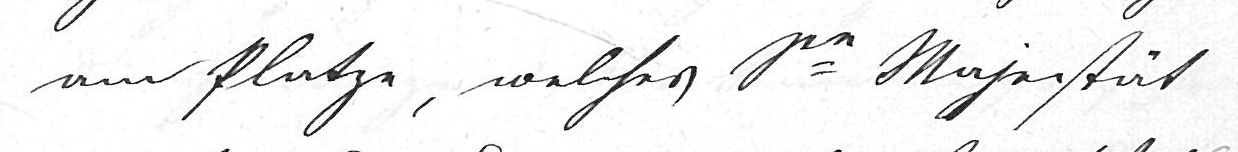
an Platze, welcher Sr Majestät
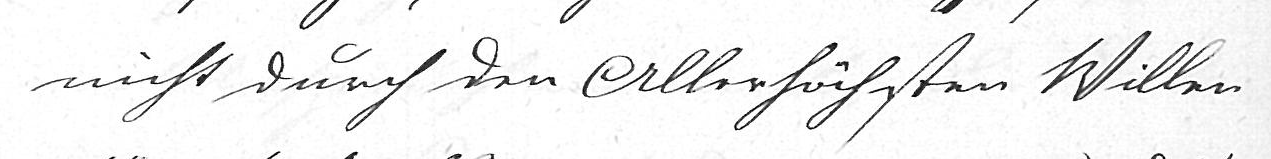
nicht durch den Allerhöchsten Willen
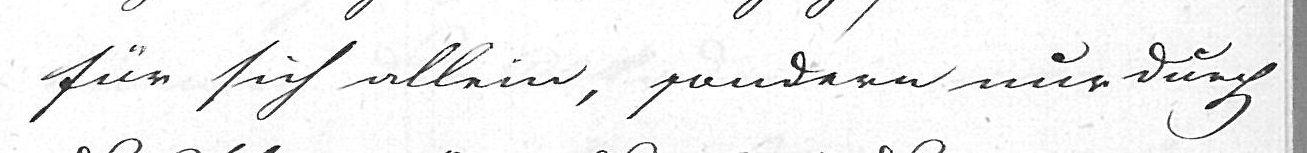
für sich allein, sondern nur durch
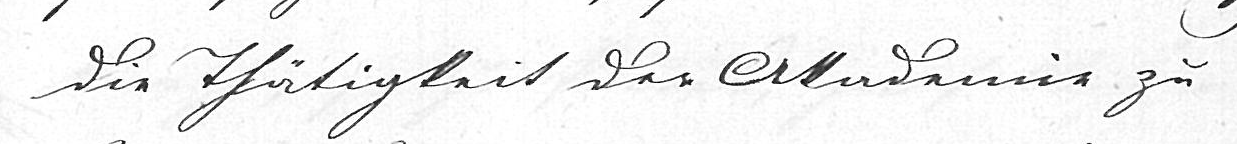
die Thätigkeit der Akademie zu
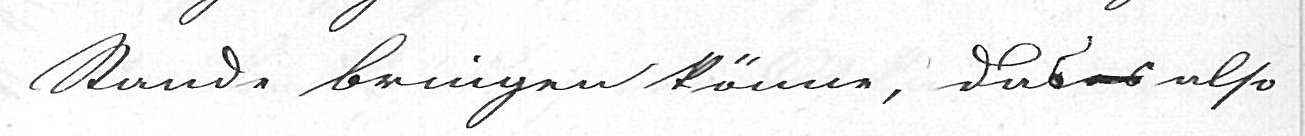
Stande bringen könne, das es also
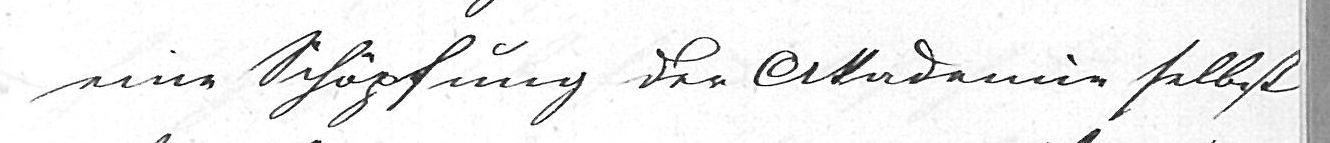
eine Schöpfung der Akademie selbst
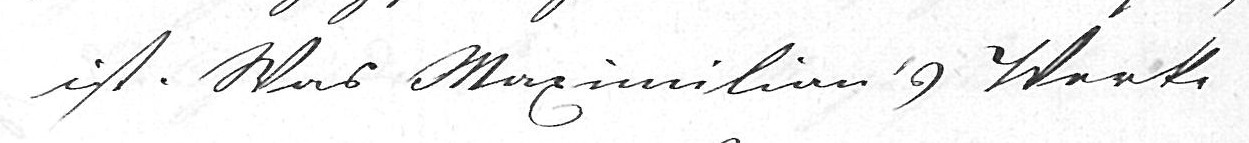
ist. Was Maximilian's Werke
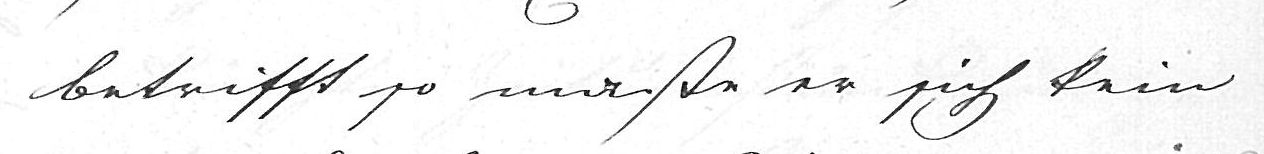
betrifft so maße er sich kein
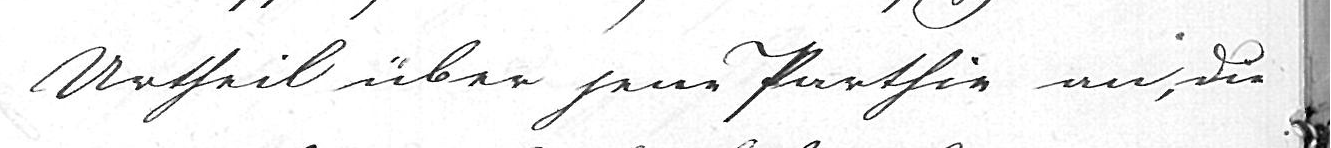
Urtheil über jene Parthie an, die
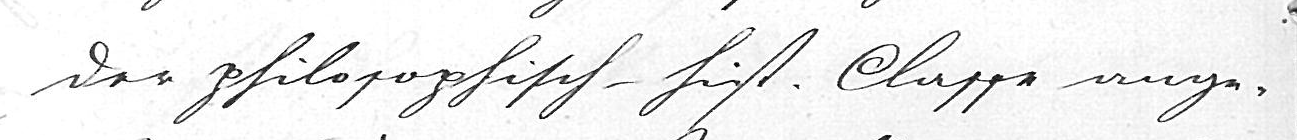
der philosophisch-hist. Classe ange-
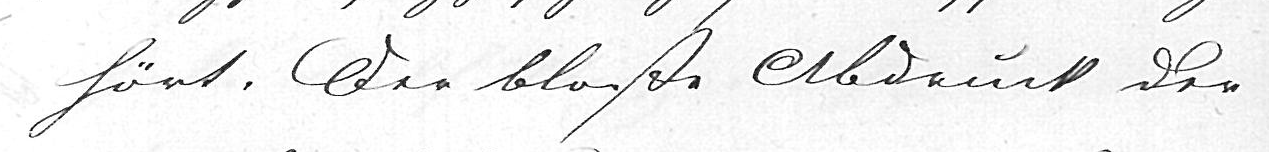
hört. Der bloße Abdruck der
